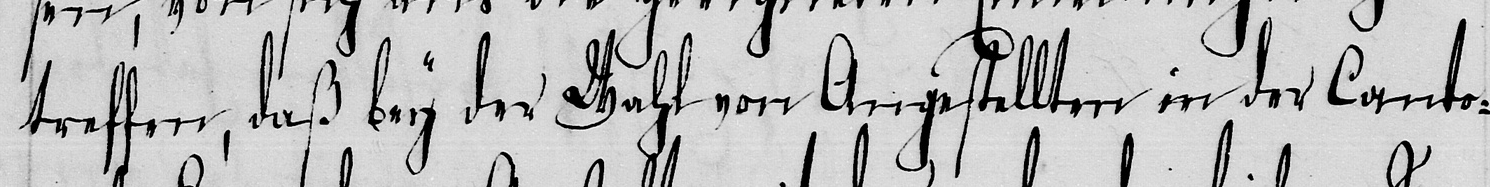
treffen, daß bey der Wahl von Angestellten in der Canto¬
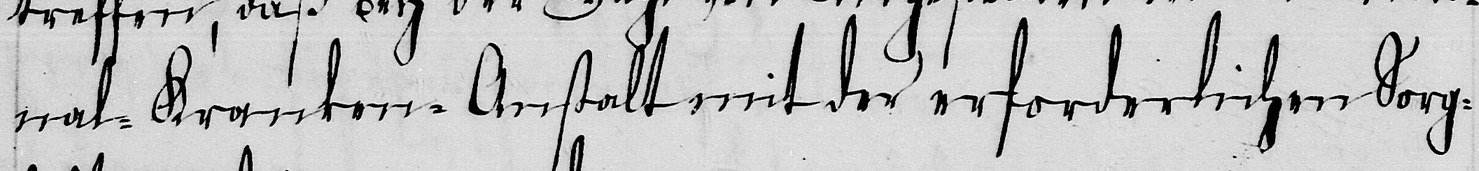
nal-Kranken-Anstalt mit der erforderlichen Sorg¬
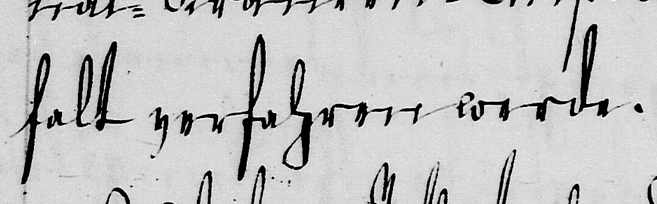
falt verfahren werde.
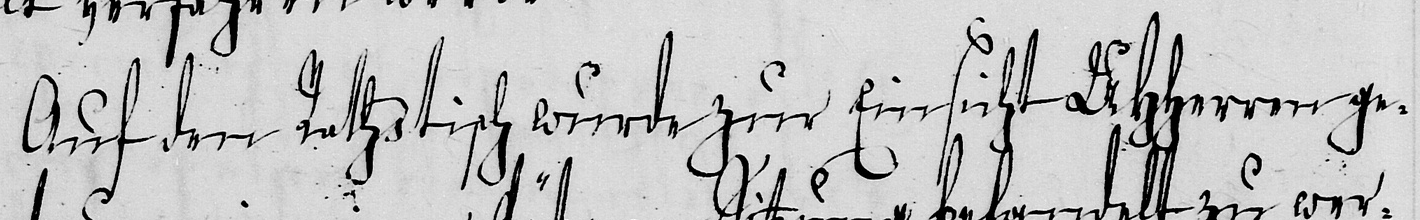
Auf den Rathstisch wurde zur Einsicht UHHerren ge¬
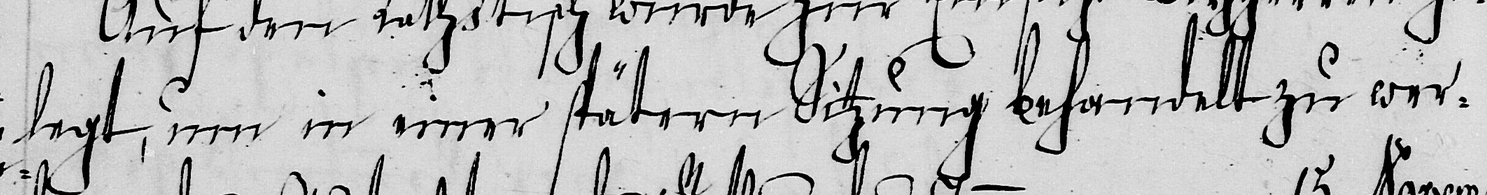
legt, um in einer spätern Sitzung behandelt zu wer¬
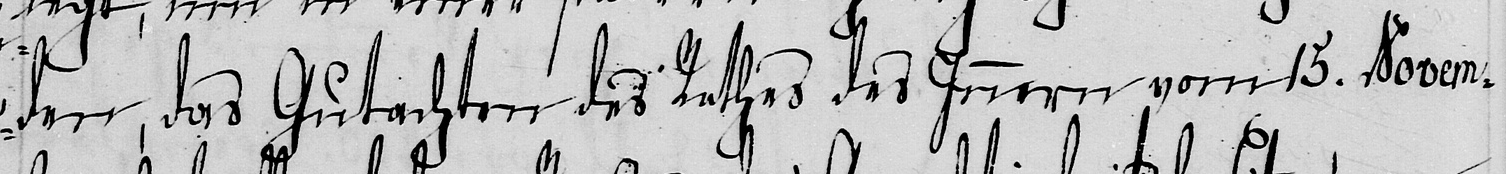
den, das Gutachten des Rathes des Innern vom 15. Novem¬
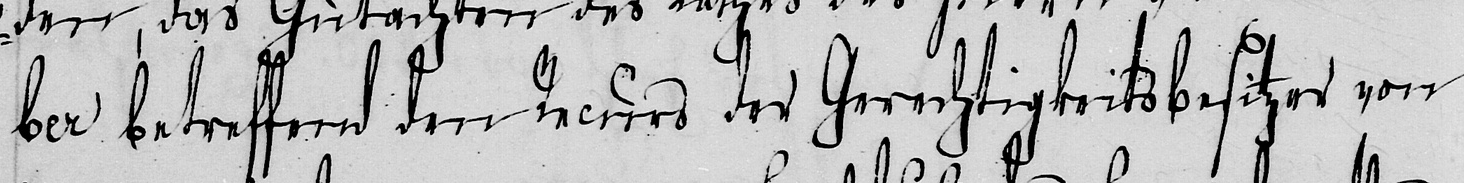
ber betreffend den Recurs der Gerechtigkeitsbesitzer von
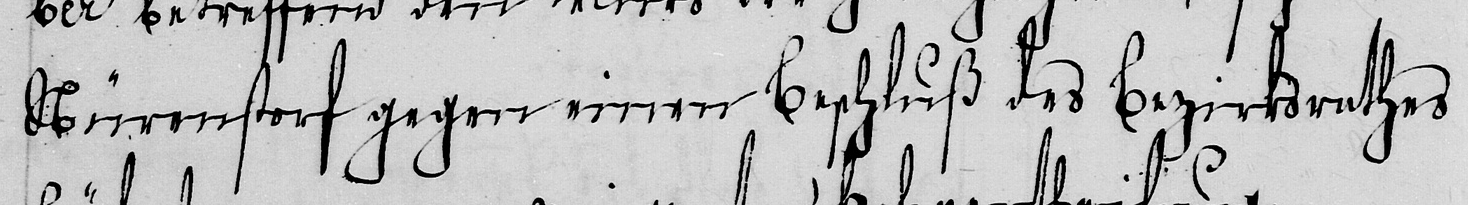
Nürenstorf gegen einen Beschluß des Bezirksrathes
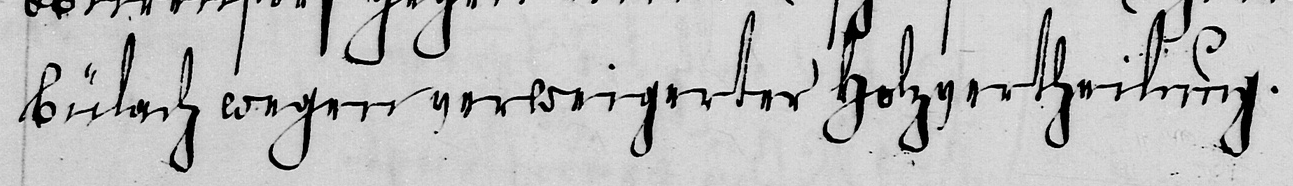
Bülach wegen verweigerter Holzvertheilung.
